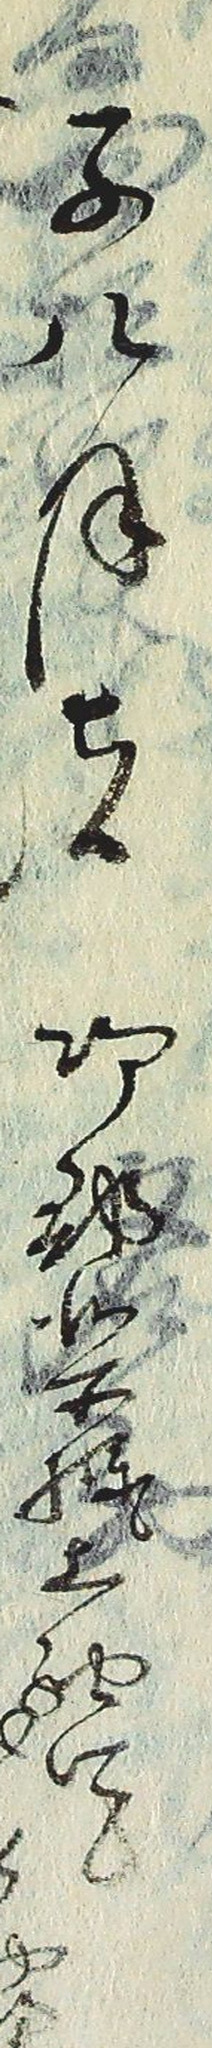子八月七日御郡代所様へ上納仕候
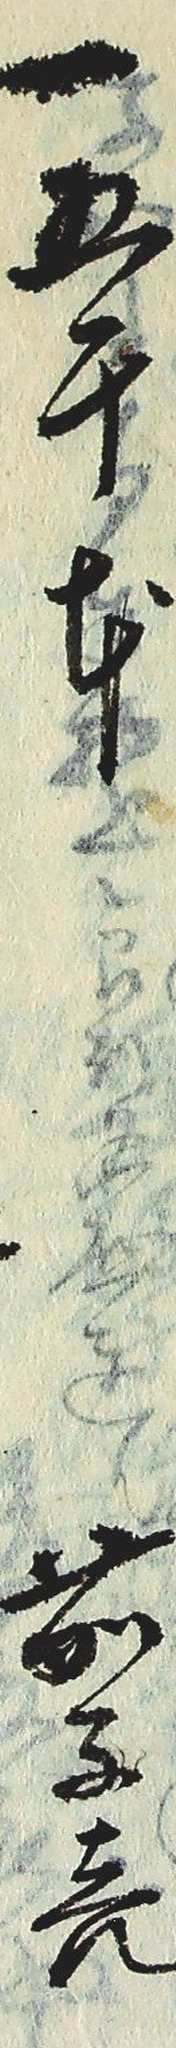一五千本茄子売
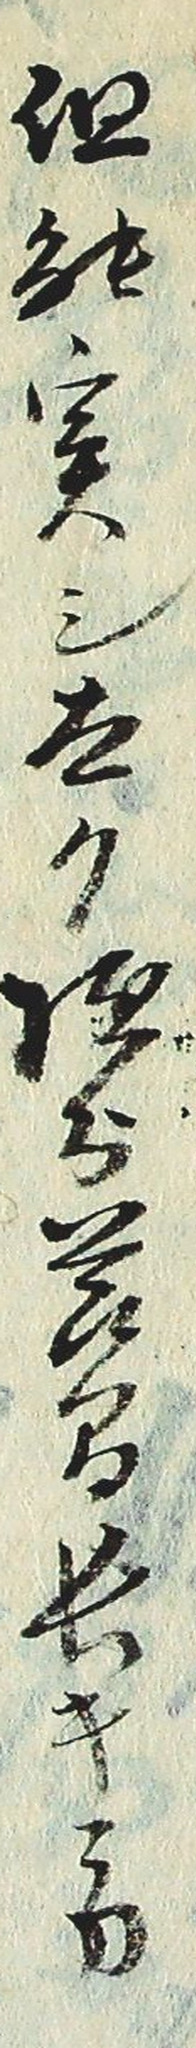但能実し太く随分節間長き方
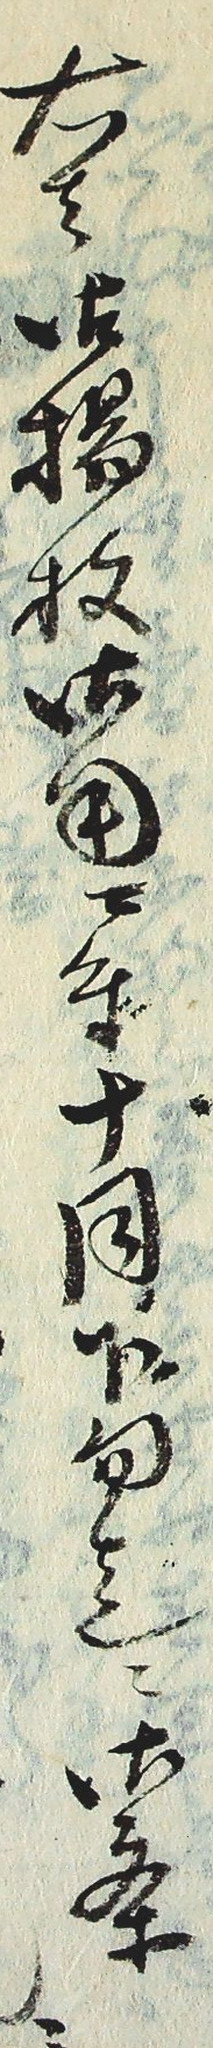右は御楊枝御用に付十月下旬迄に御茶
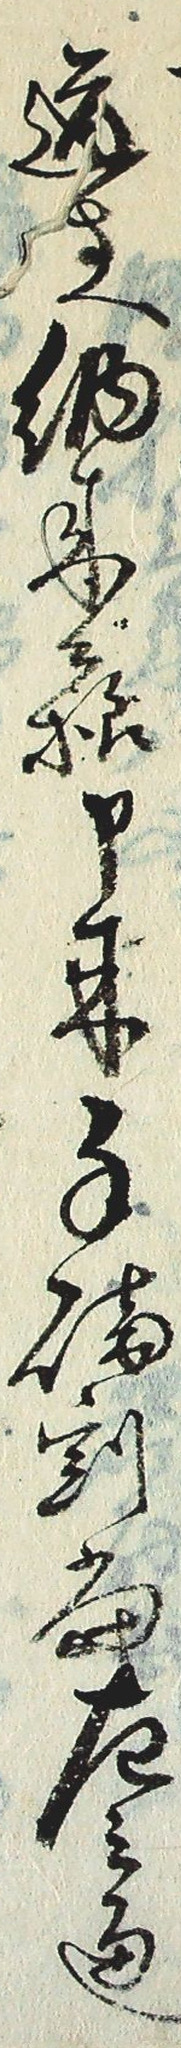道方へ納来候様申来手崎割当左之通に
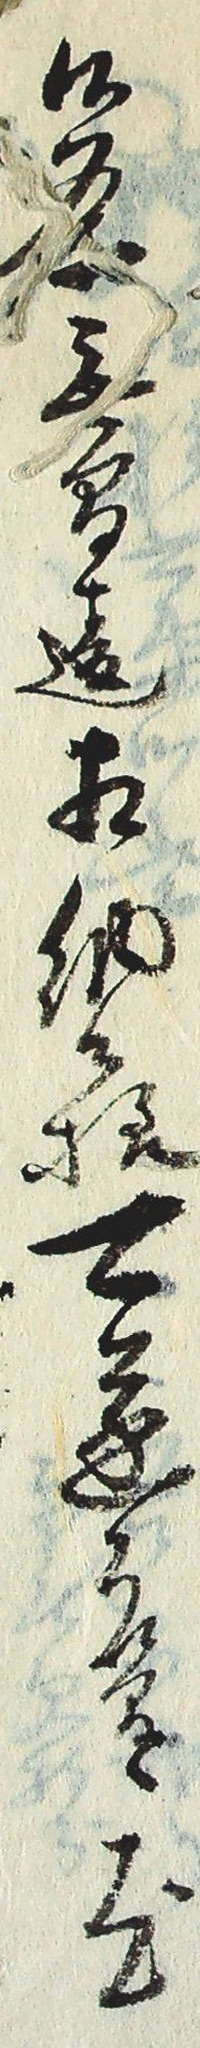候条無間違相納候様可遂了簡候尤

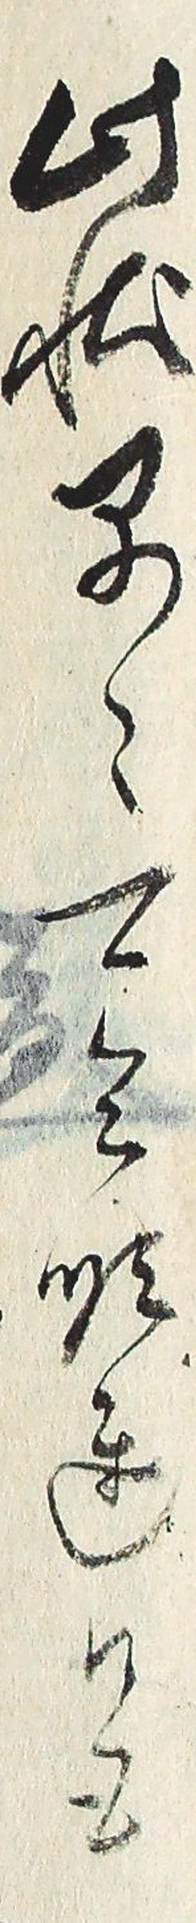此状早々可令順達候以上
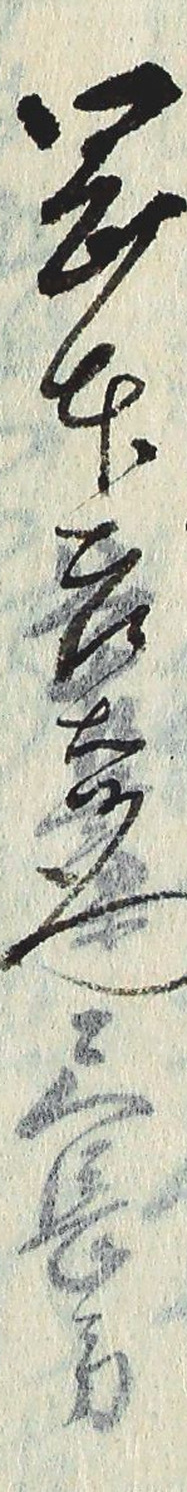岡本吉右衛門
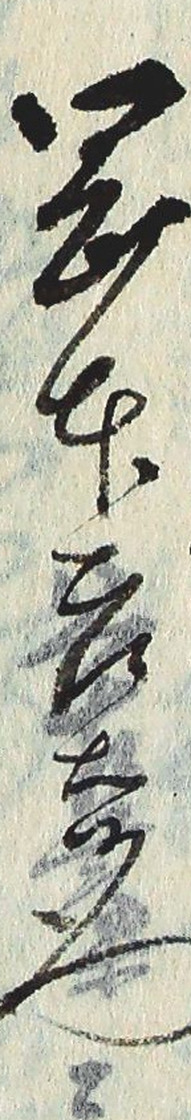岡本吉右衛門
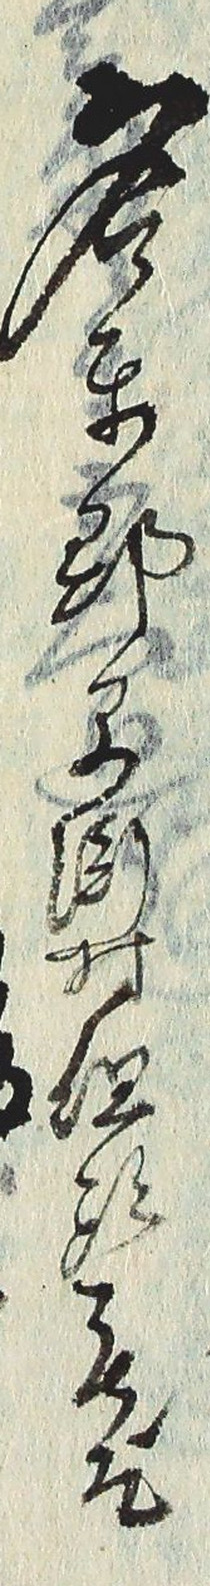名東郡早淵村組頭庄屋
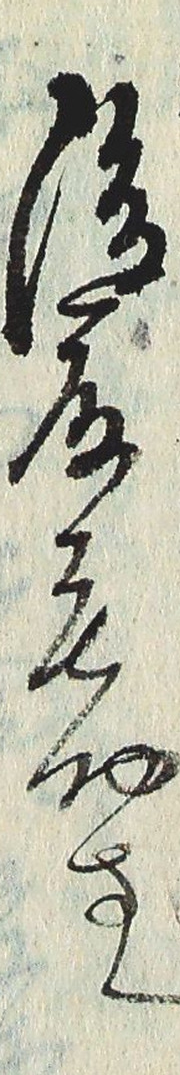後藤庄助方へ
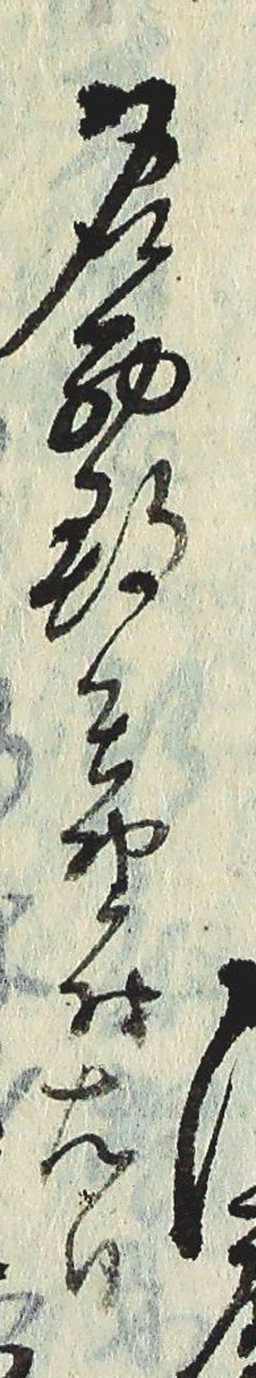名西郡矢野村右同
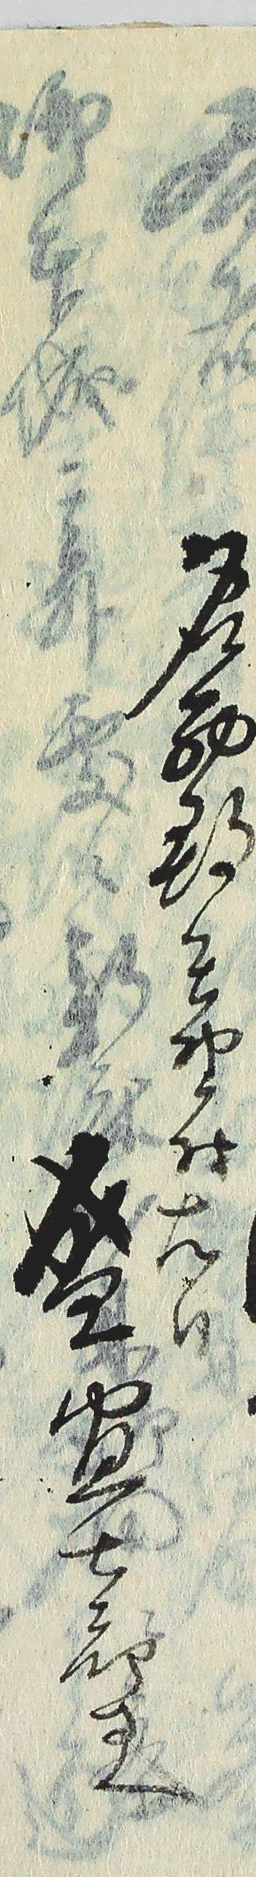盛宣七郎方へ
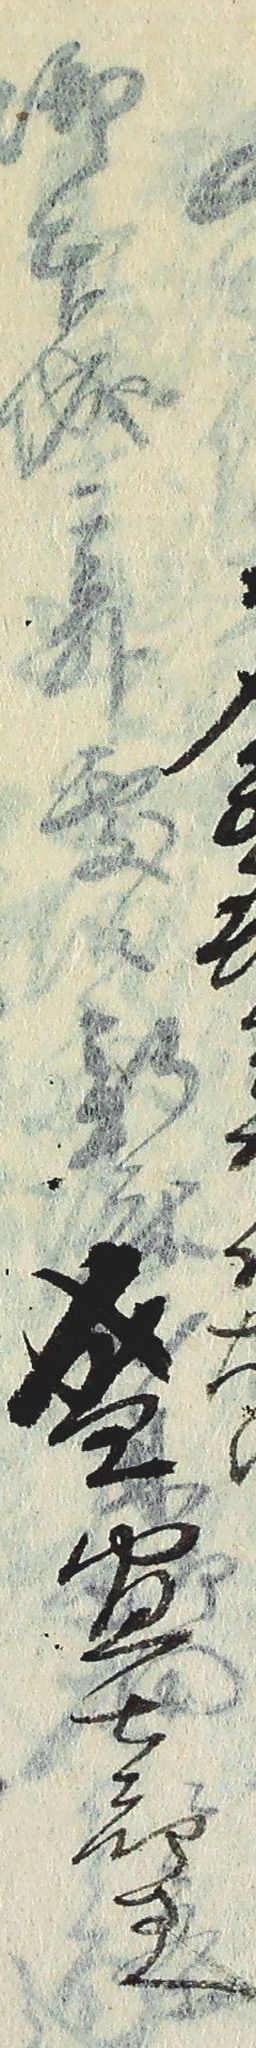盛宣七郎方へ
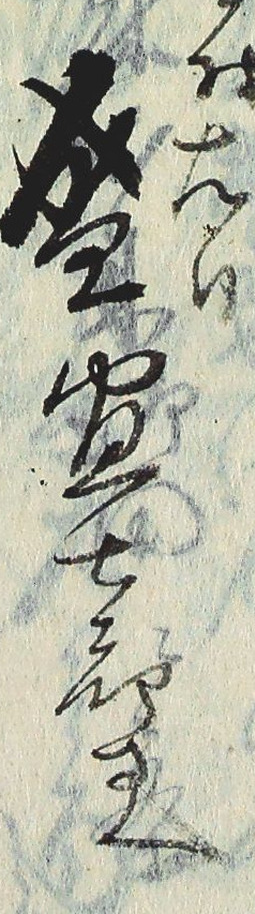盛宣七郎方へ
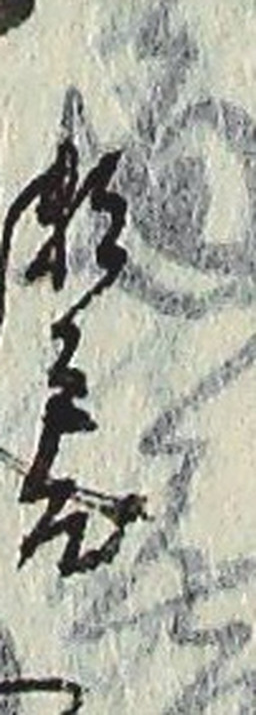瀬戸屋
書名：名東郡中諸割賦元帳
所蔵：鳴門教育大学 Naruto University of Education
